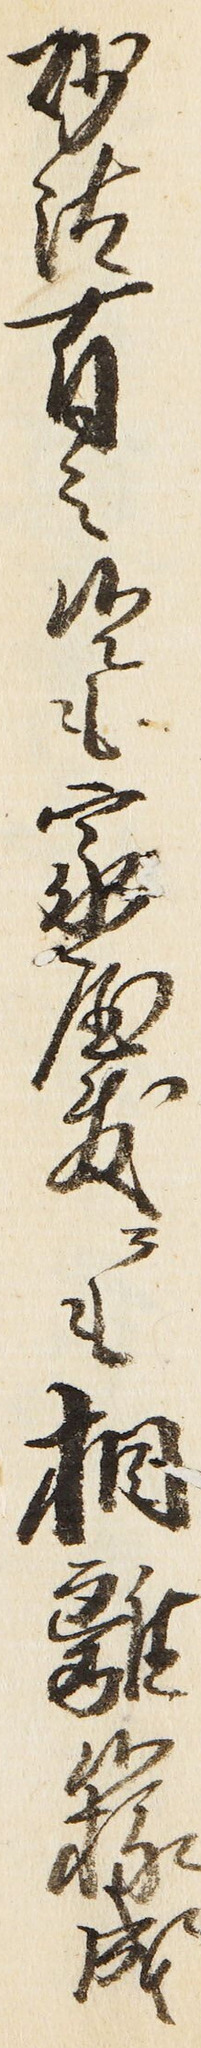沙汰有之候ニも家屋敷ニも相離候様ニ成
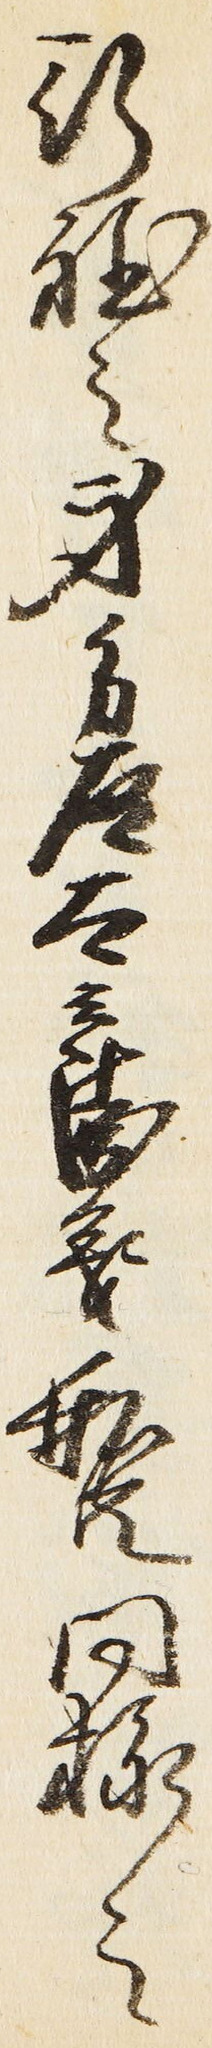行程之身方故太兵衛義私共同様之
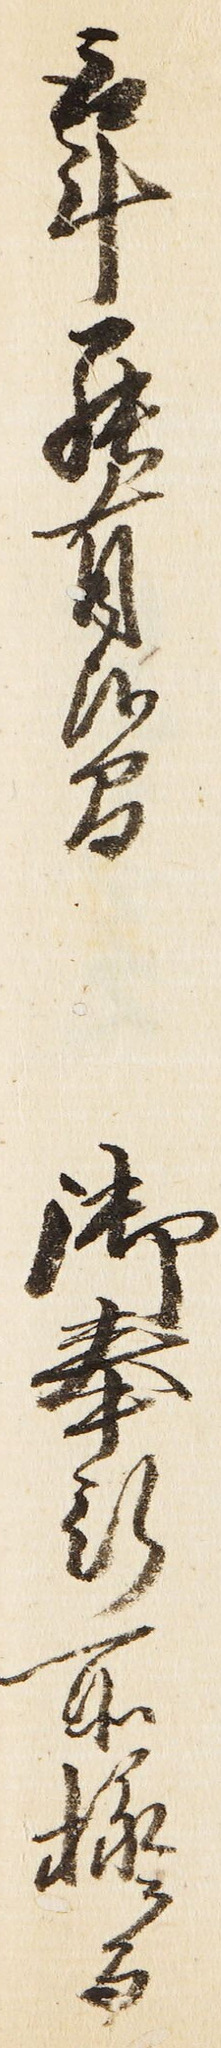取計罷有候間御奉行所様ニ而
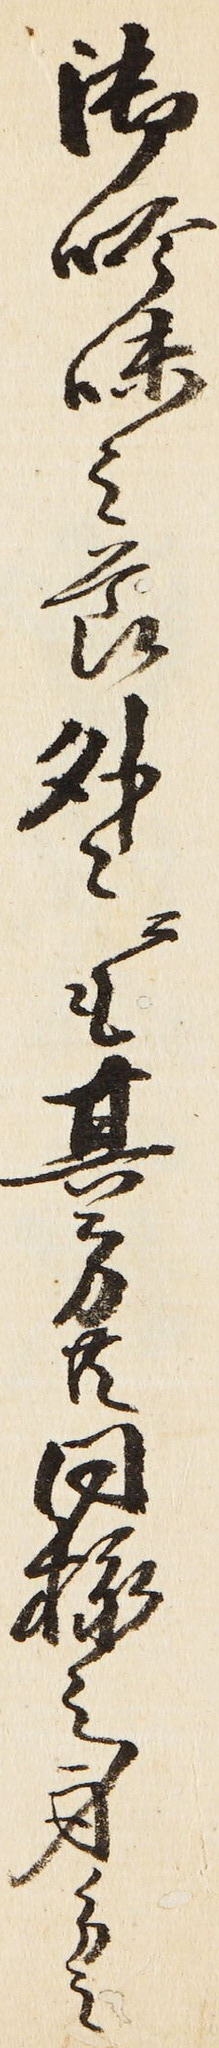御吟味之節外々ニも其方共同様之身方之
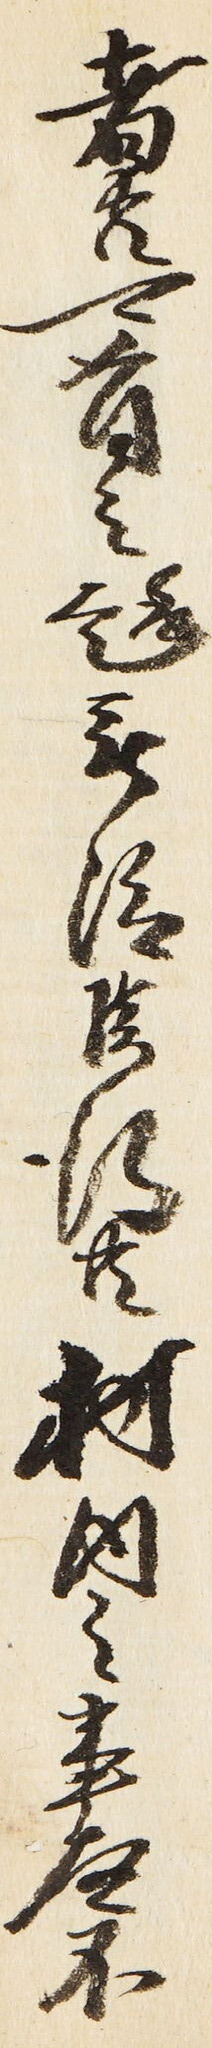者共可有之趣被仰候得共村内之事故不
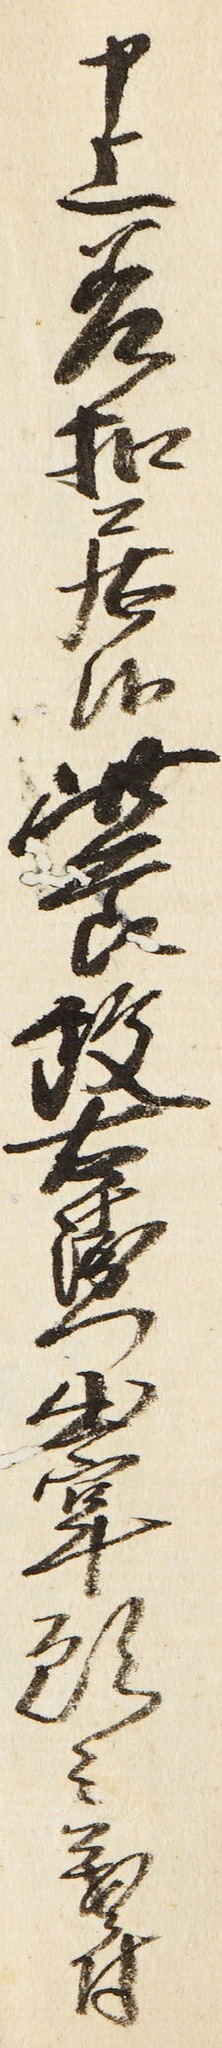申上差控居候此節政右衛門出牢願之義ニ付
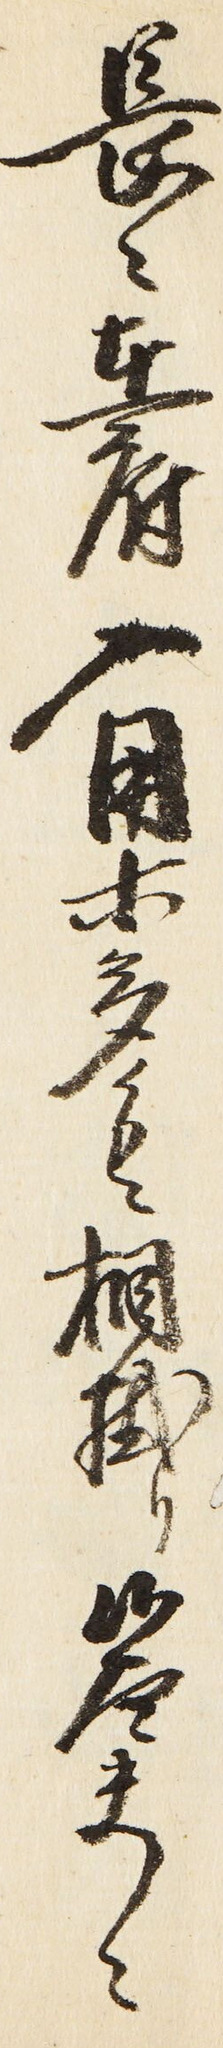長々在府入用等多分ニ相掛り候故夫々
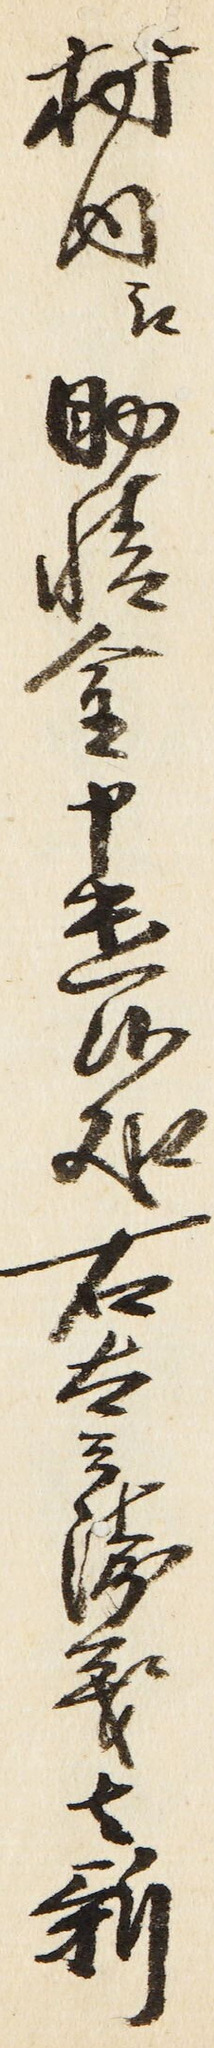村内江助情金申遣候処右太兵衛義者新
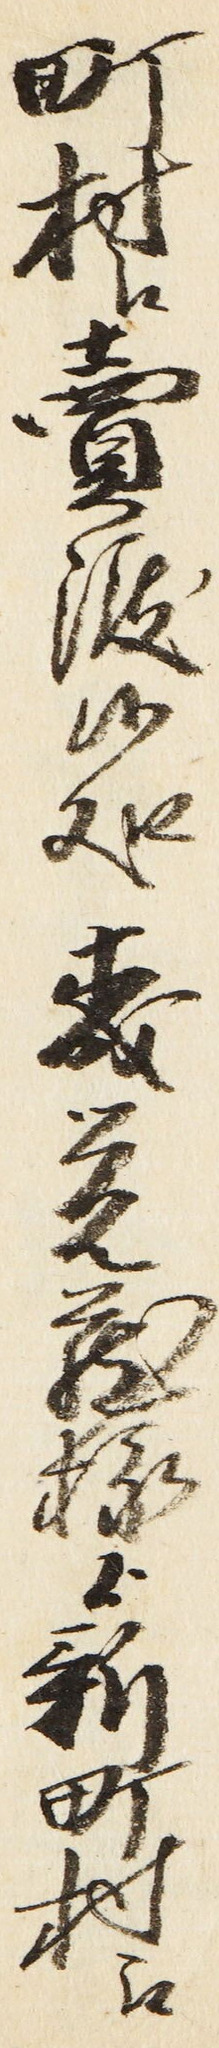町村江売渡候処森覚蔵様ゟ新町村江
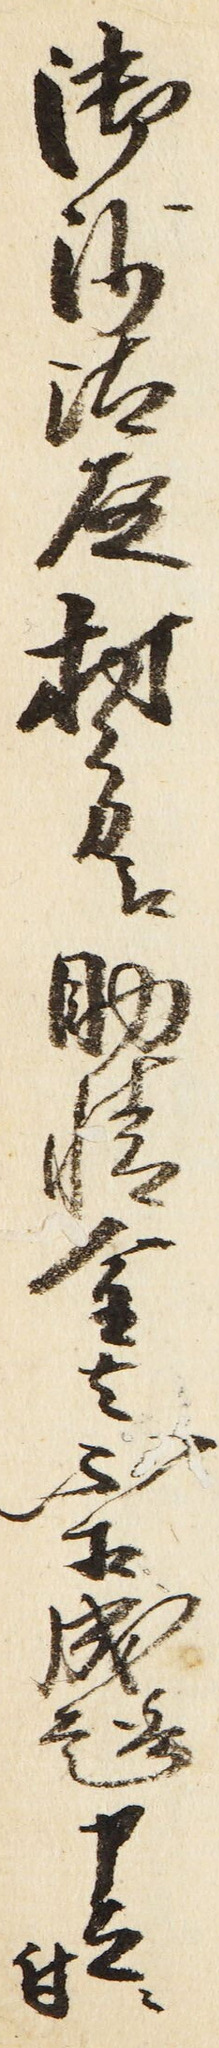御沙汰故村方江助情金者不相成趣申立ニ付

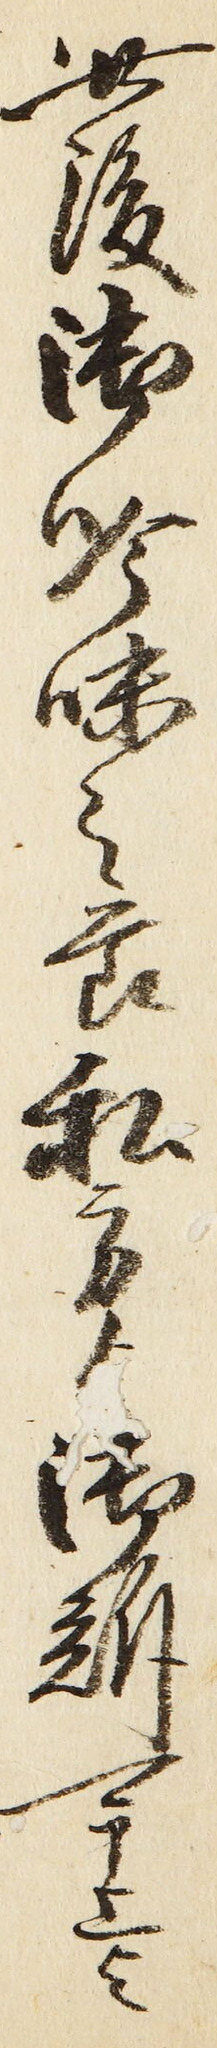此後御吟味之節私方ゟ御訴可申上与
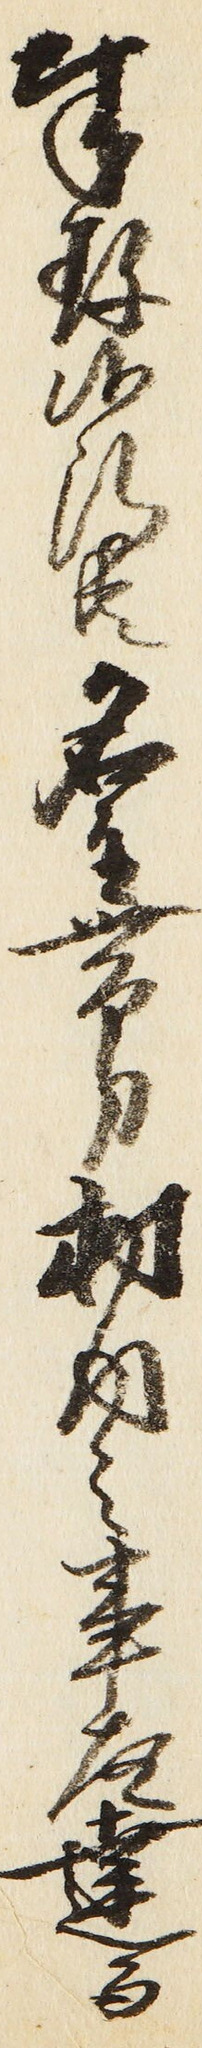奉存候得共名主帯刀村内之事故達而
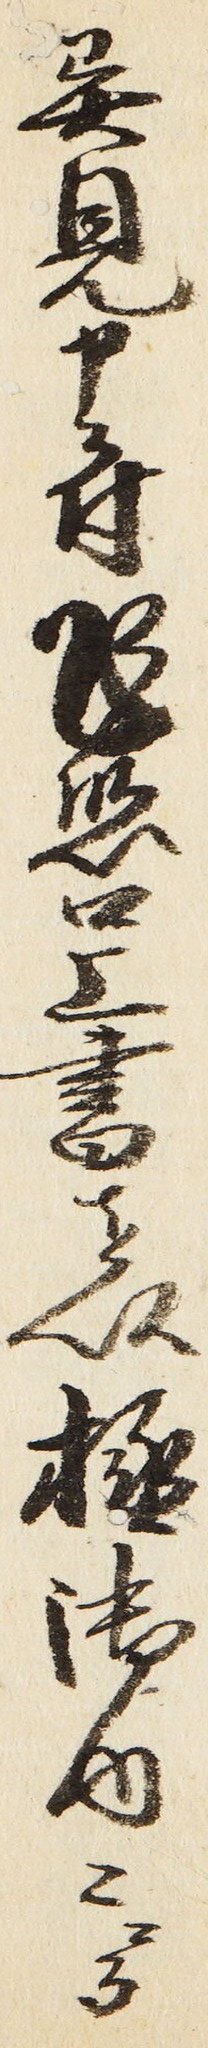異見申ニ付乍恐口上書を以極御内々ニ而
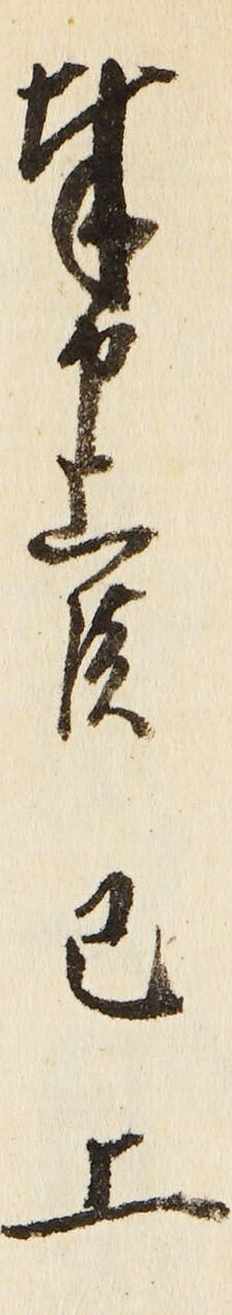奉申上候已上
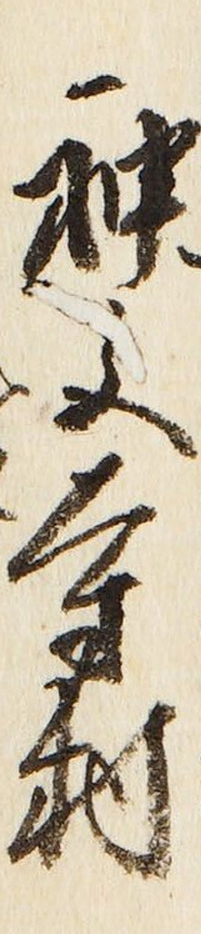神宮寺村
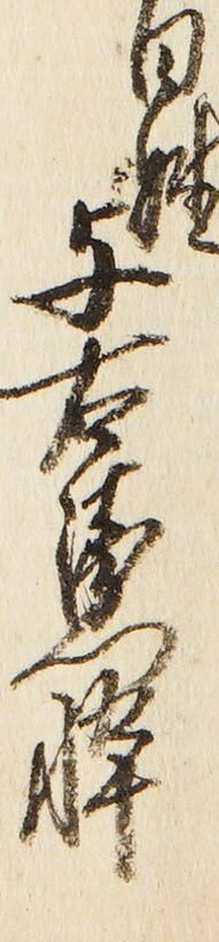与右衛門忰
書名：難船一件記録
